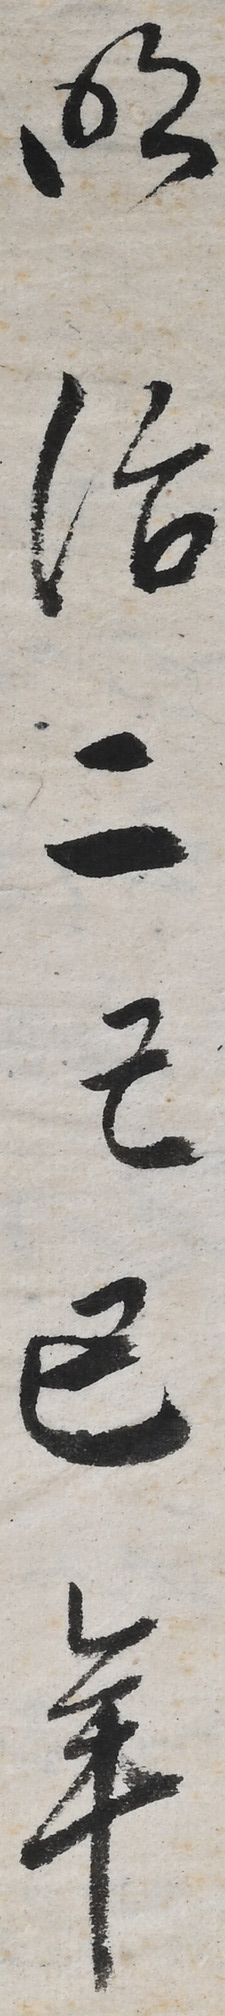明治二己巳年
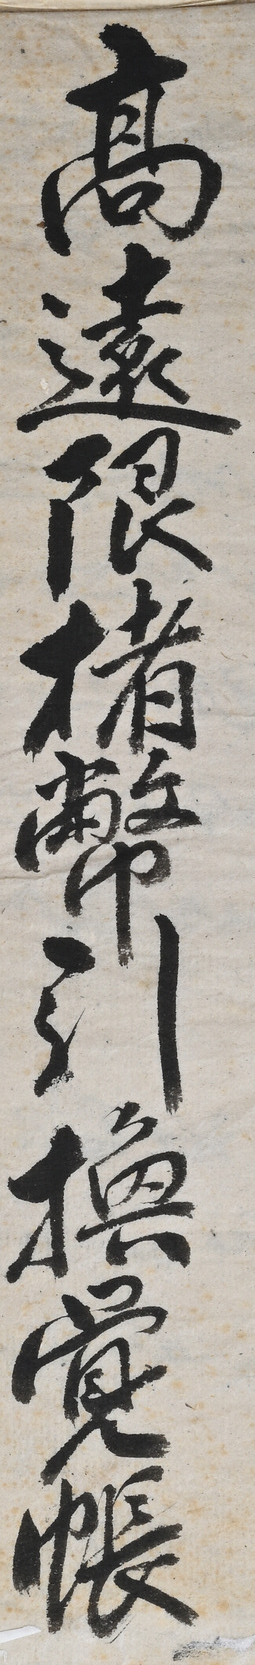高遠限楮幣引換覚帳
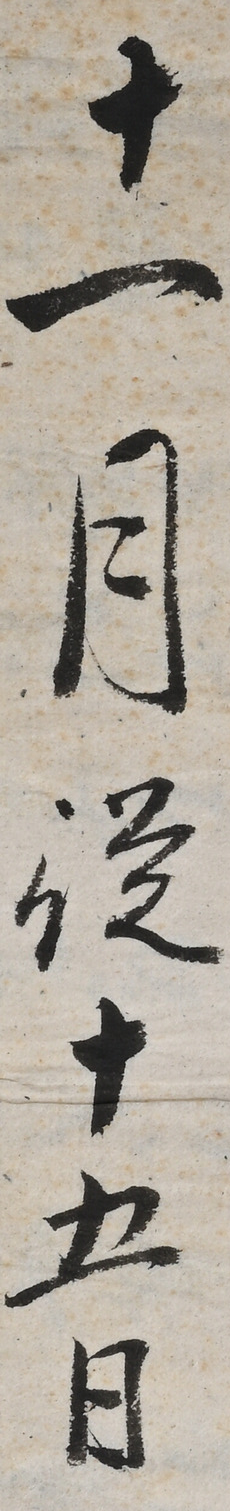十一月従十五日

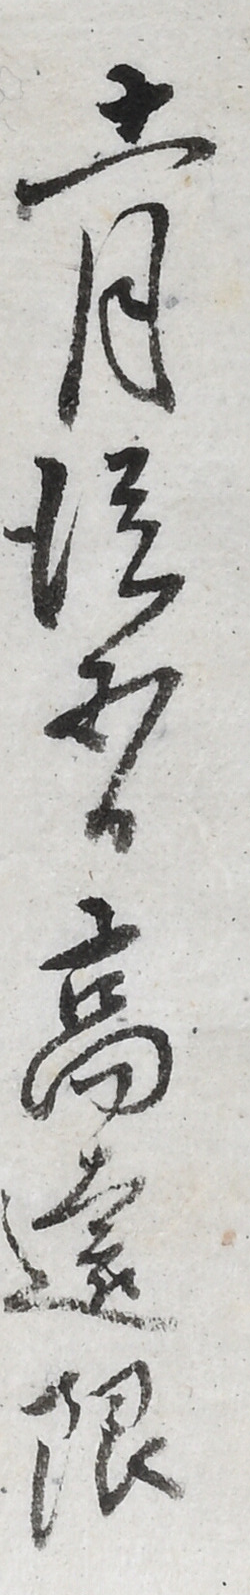十一月従五日高遠限
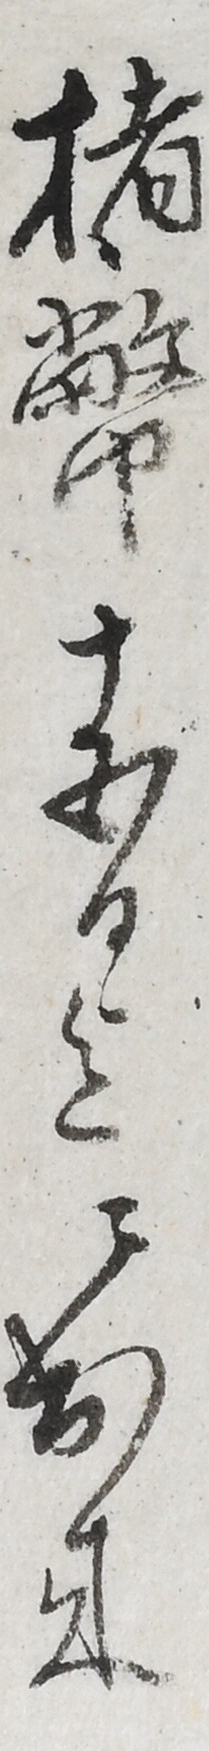楮幣十五日迄ニ出来
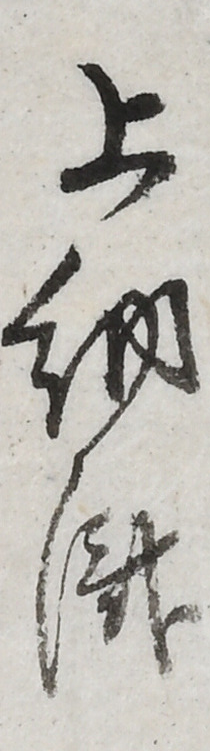上納済
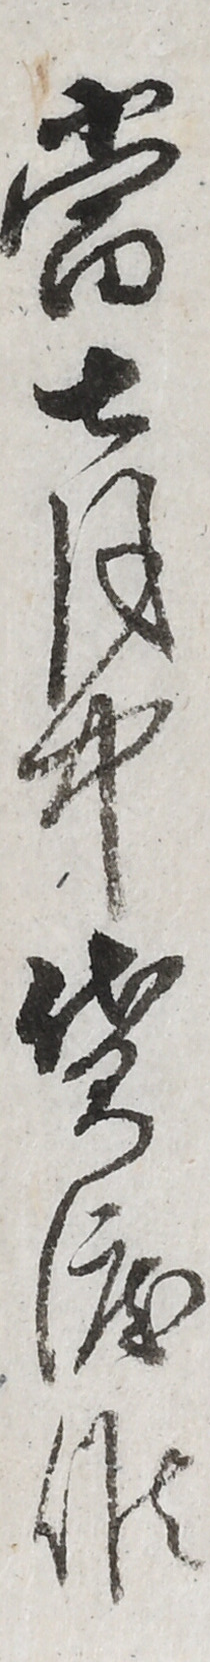当七月中貸渡候
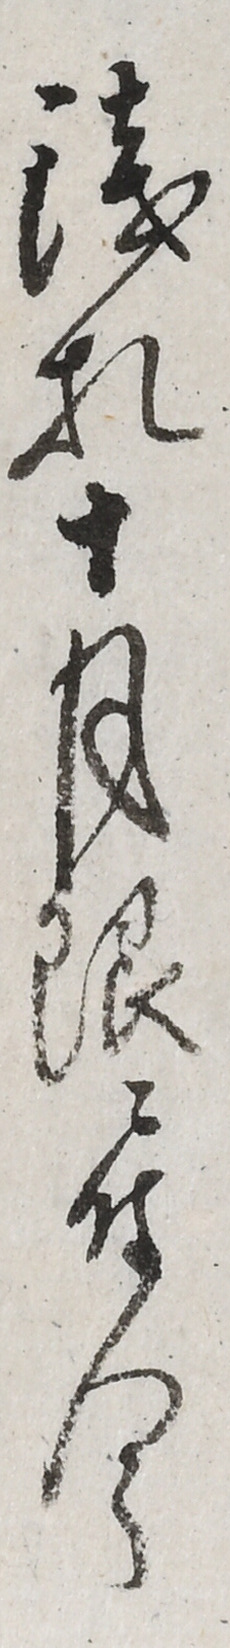銭札十月限ニ付今
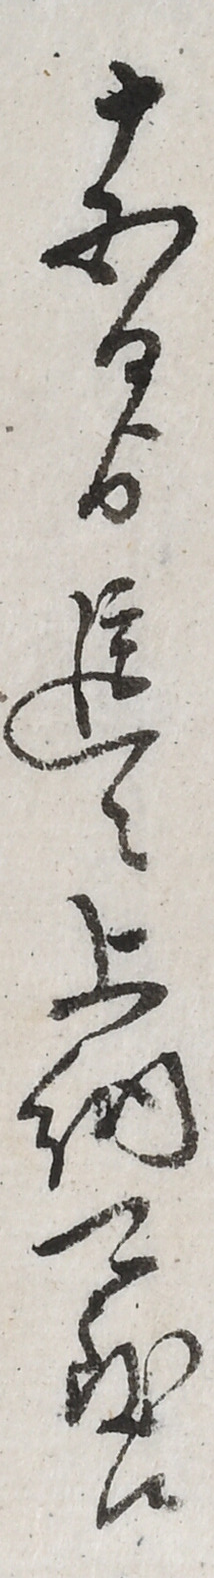十五日ゟ追々上納可致候
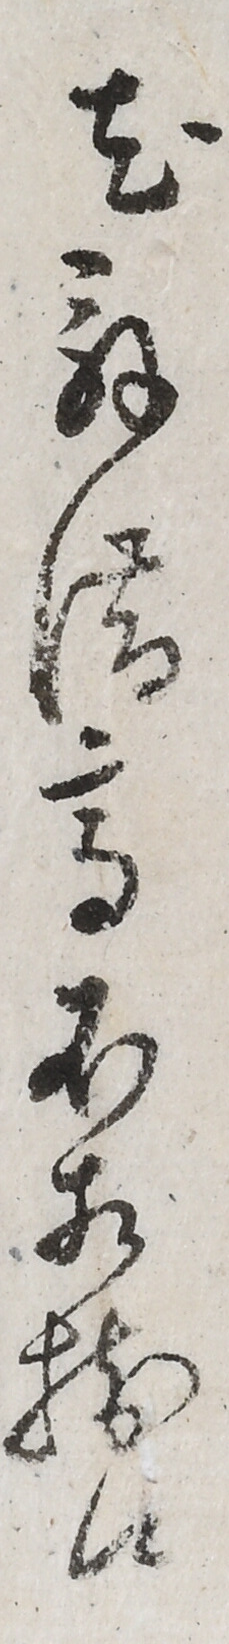尤拝借高不相揃候
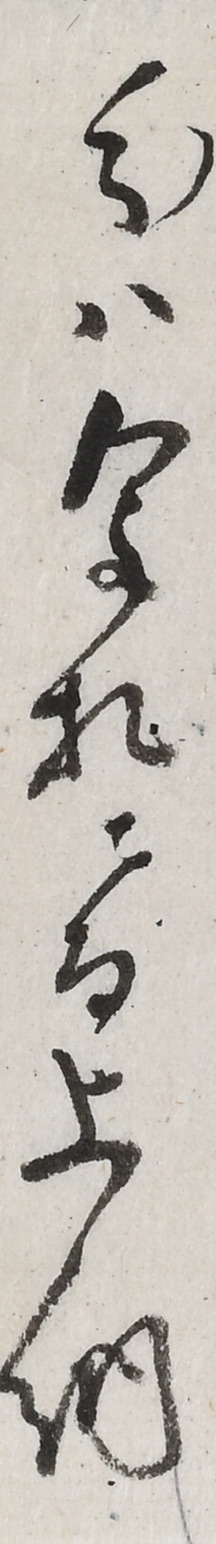分ハ金札ニ而上納
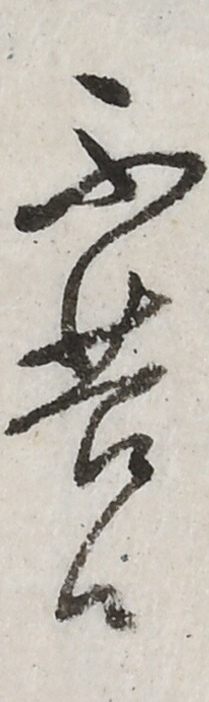不苦候
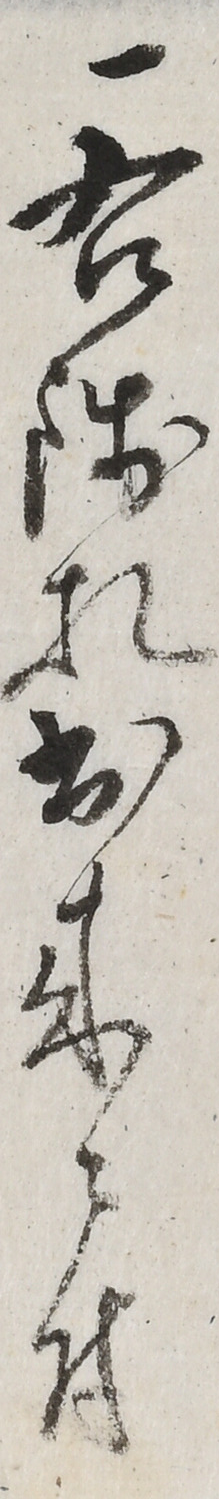一右銭札出来ニ付
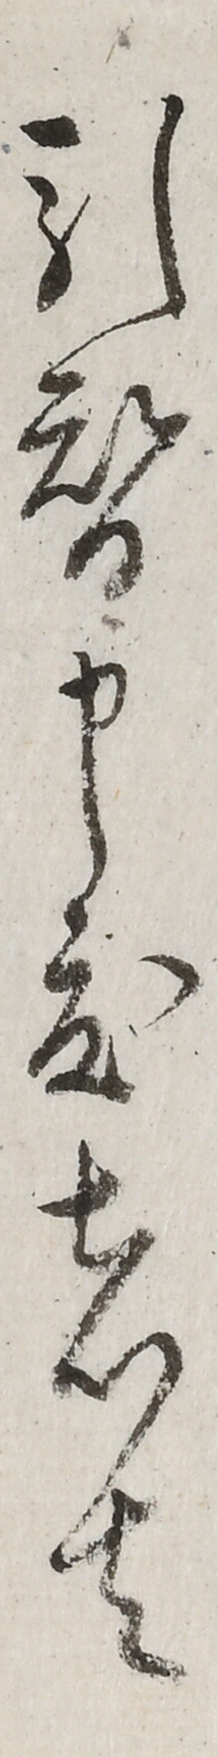引替申度者は
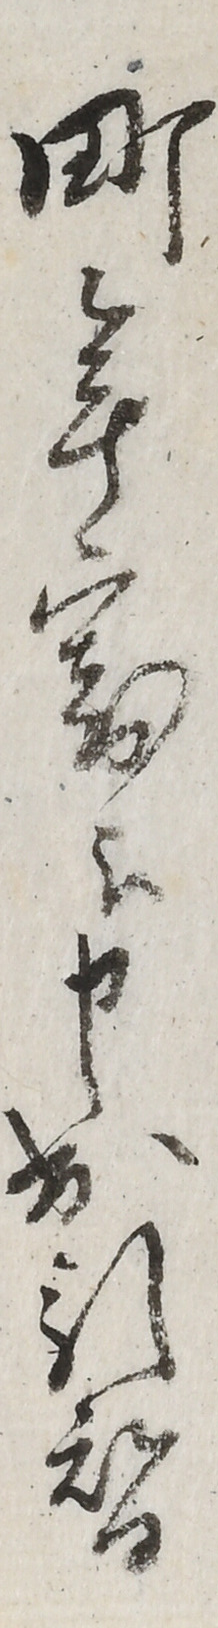町年寄江申出引替
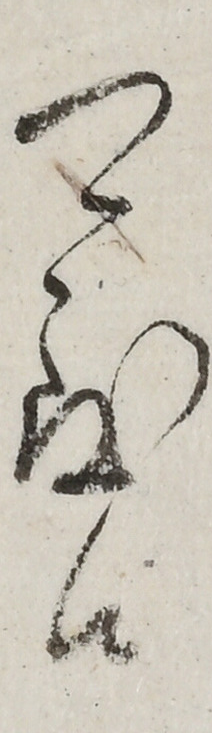可致候
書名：髙遠限楮幣引換覚帳
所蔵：伊那市立高遠町図書館・合同会社AMANE
